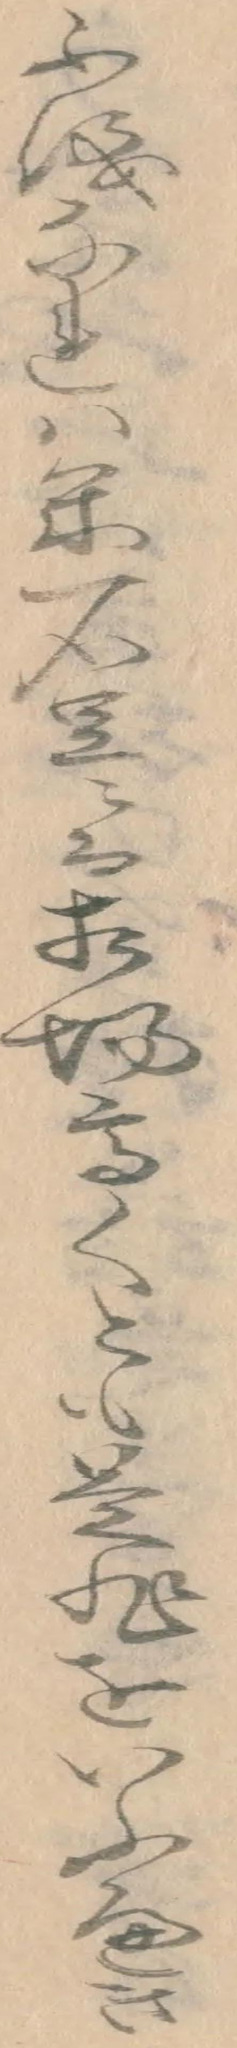不儀なれは米不足に而相場高くとも是非をいふへき
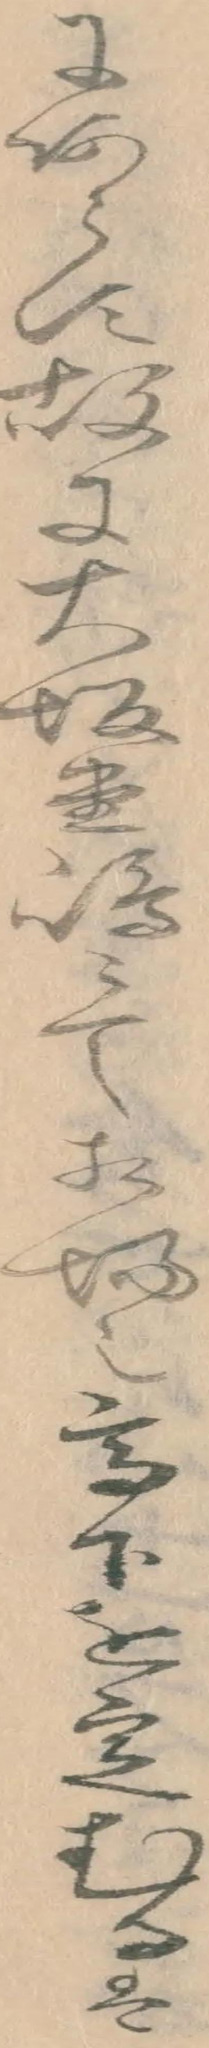にあらす故に大坂堂島にて相場之高下を定むるは
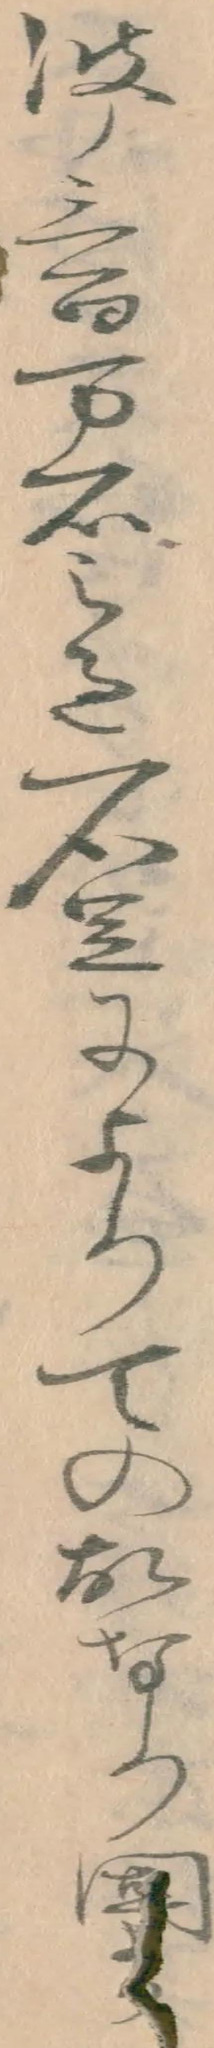彼の三百万石之過不足によりての故なり固より
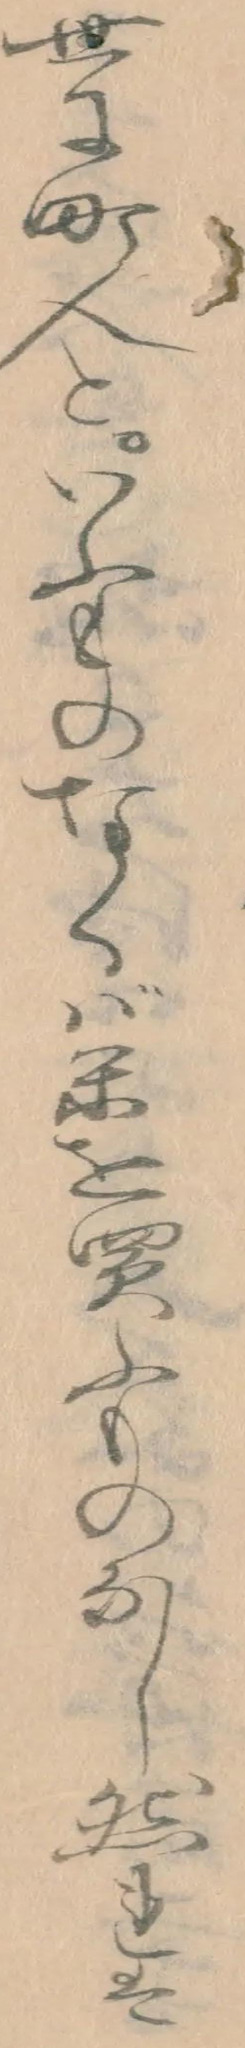世に町人と。いふものなくば米を買ふものなし然れは
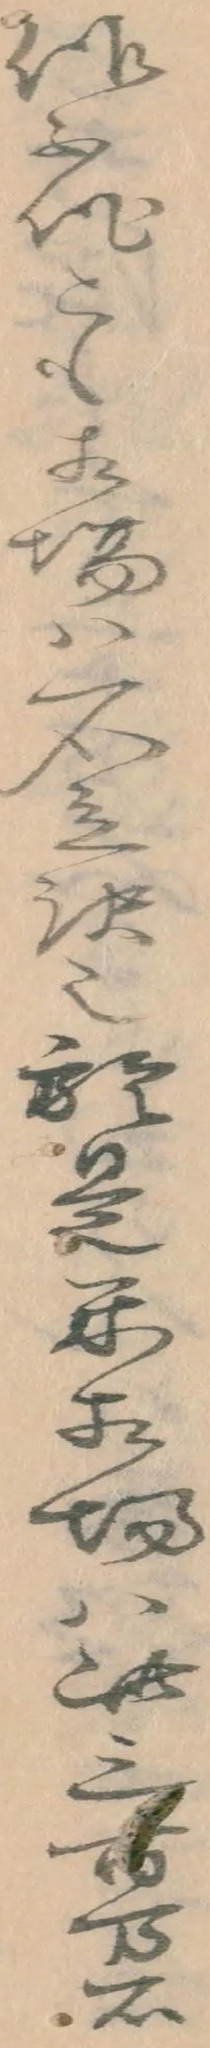作不作とも相場は不立訳也於是米相場は此三百万石
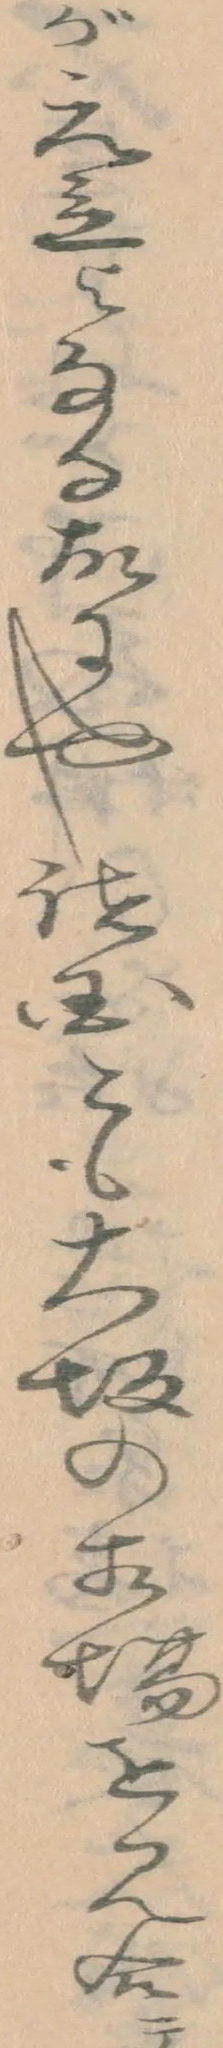が元立となる故に也諸国とも大坂の相場を見合て
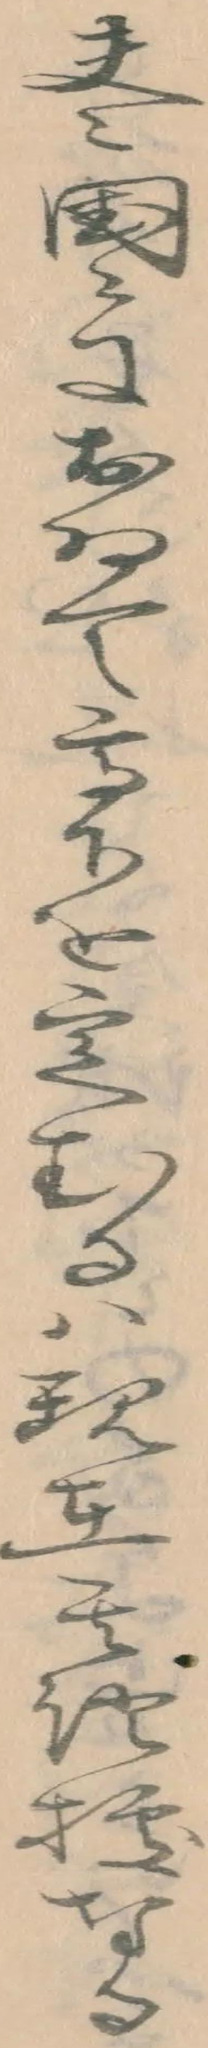夫々国々におゐて高下を定むるは現在其證拠なる
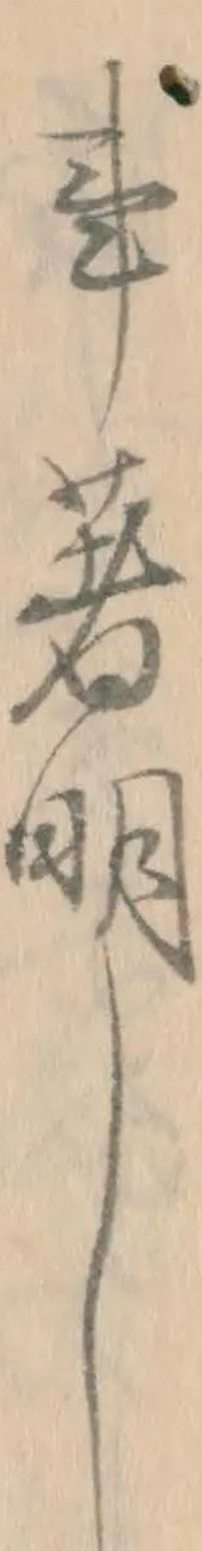事著明し
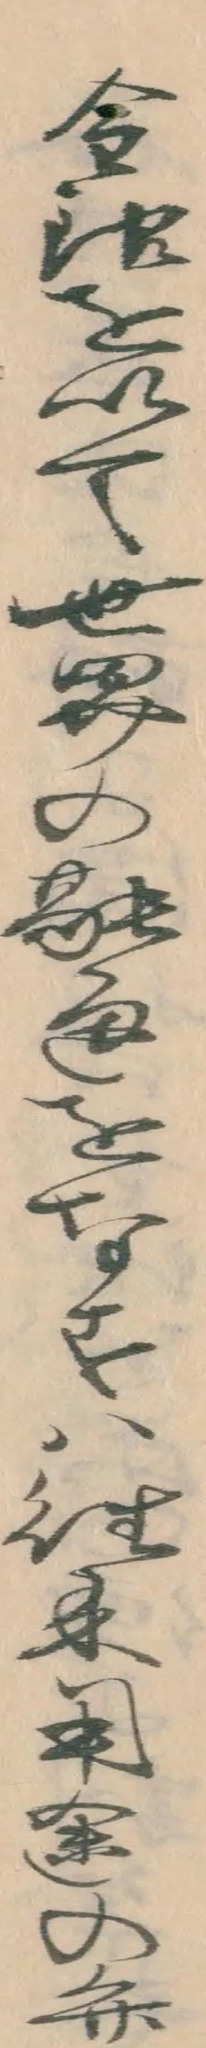一金銀を以て世界の融通をなすは往来用途の弁
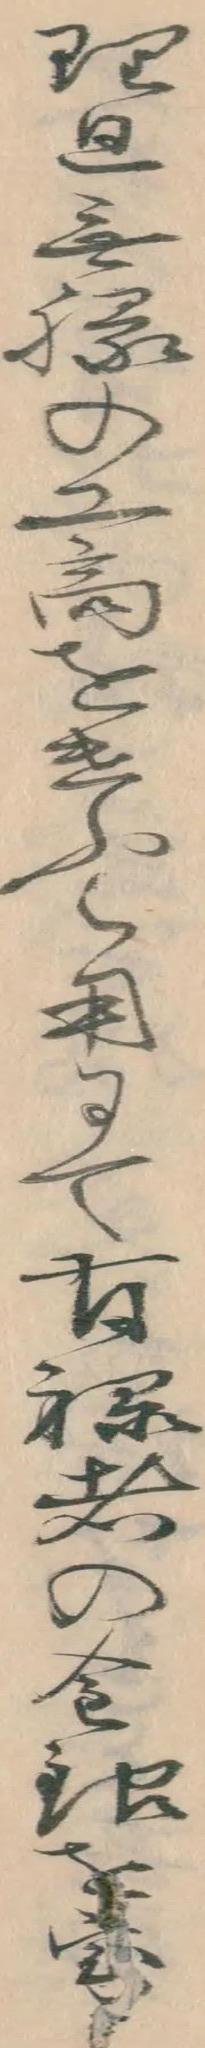理旦無禄の工商を遣ふ之用にて有禄者の金銀を宝と
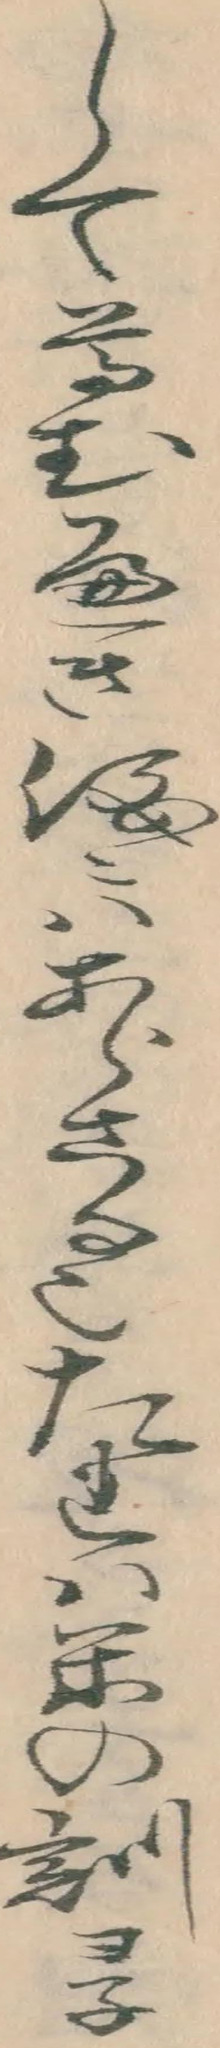して尊むへき儀にはあらさる也左れは米の訓ヨネ
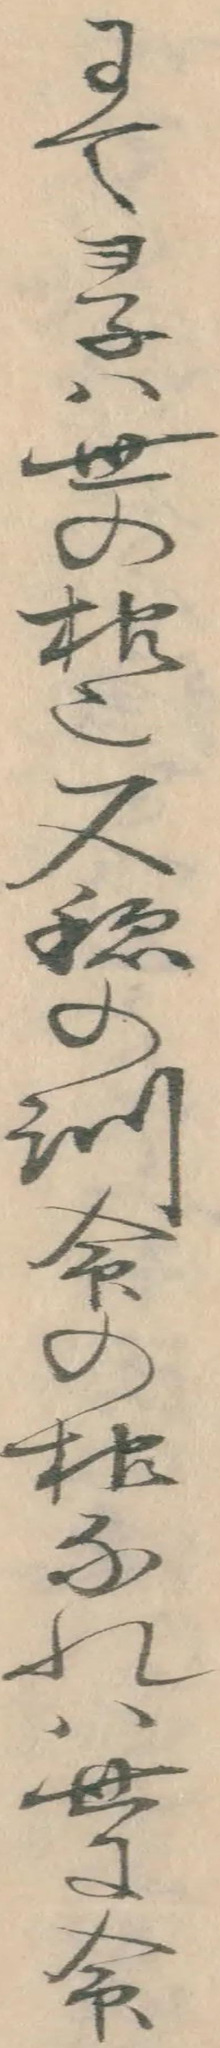にてヨネは世の根也又穂の訓命の根なれは世に命
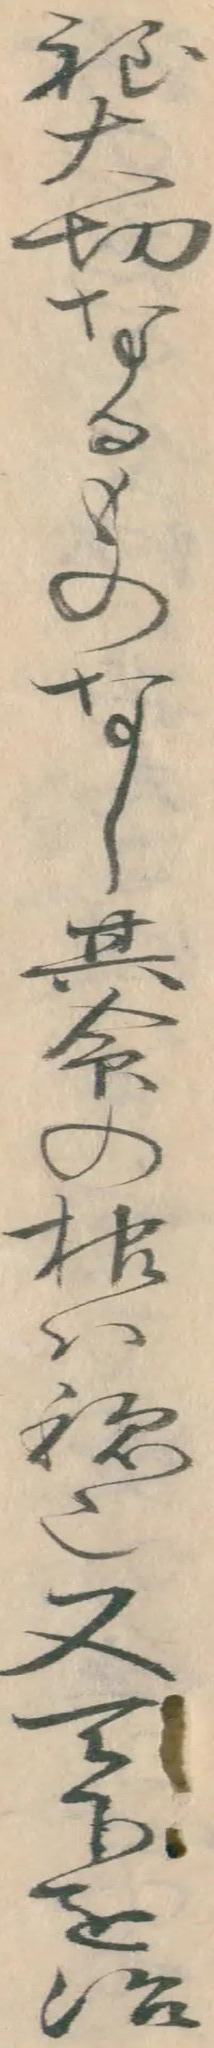程大切なるものなし其命の根は穂也又天下を治
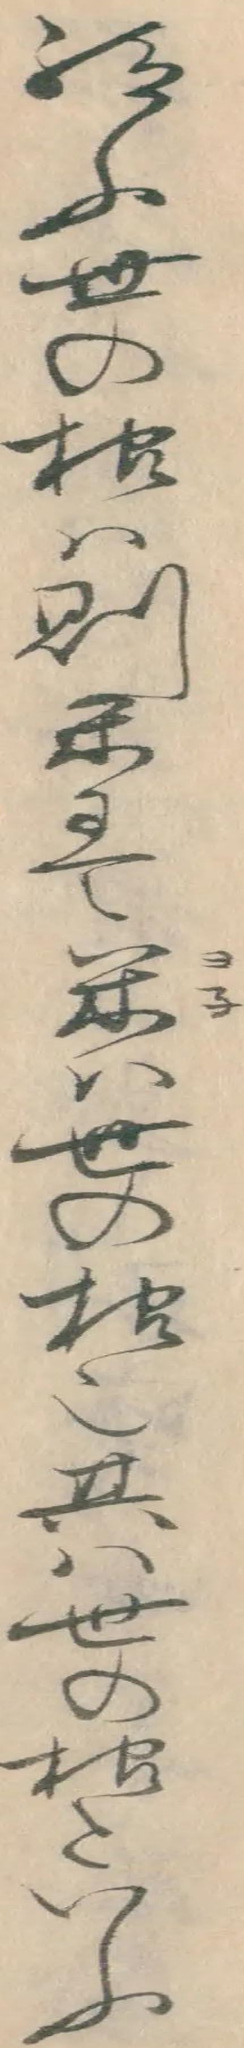給ふ世の根は則米にて米は世の根也其は世の根といふ
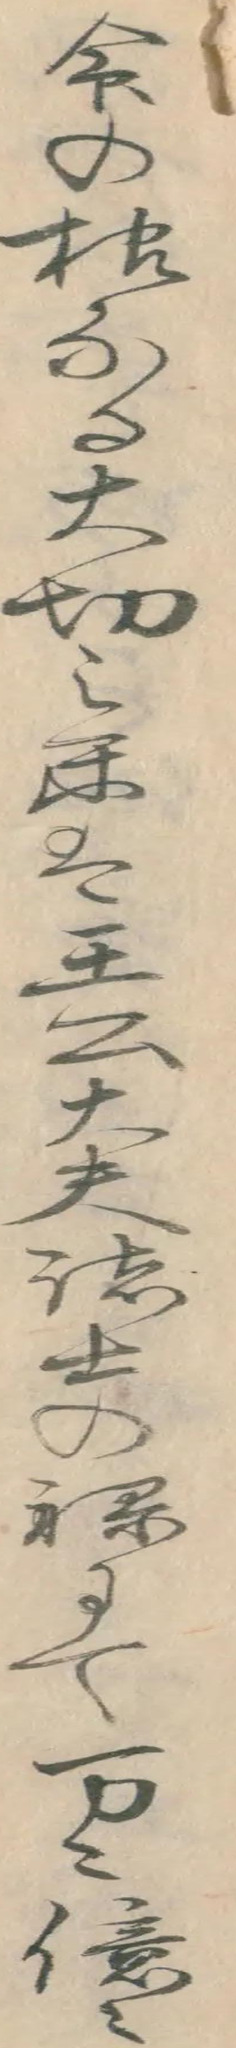命の根なる大切之米は王公大夫諸士の禄にて万々億々
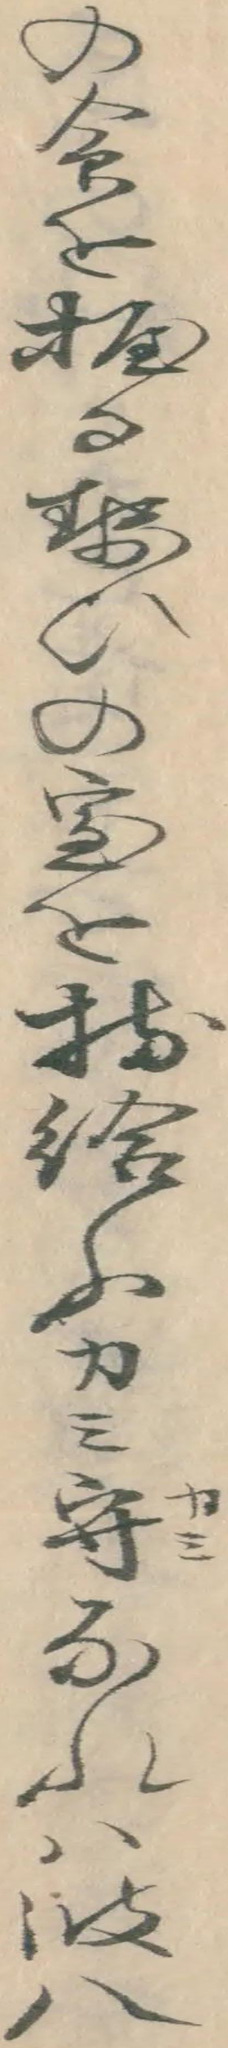の命を握る勢ひの宝を持給ふカミ守なれは彼八
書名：斎庭之穂
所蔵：国立国会図書館 National Diet Library, JAPAN
